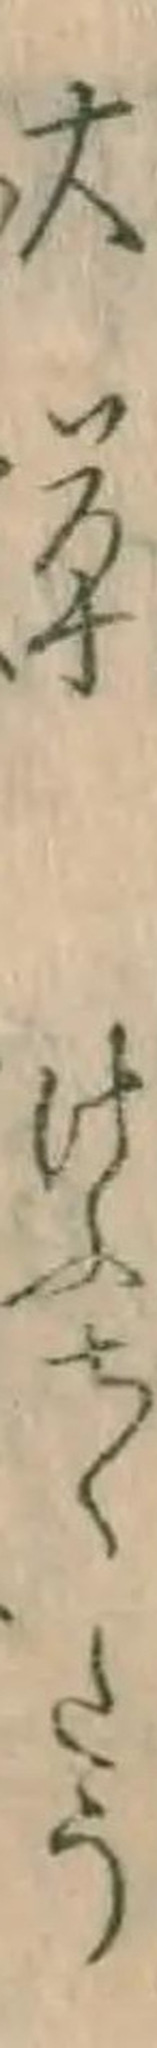大草けふちくたう
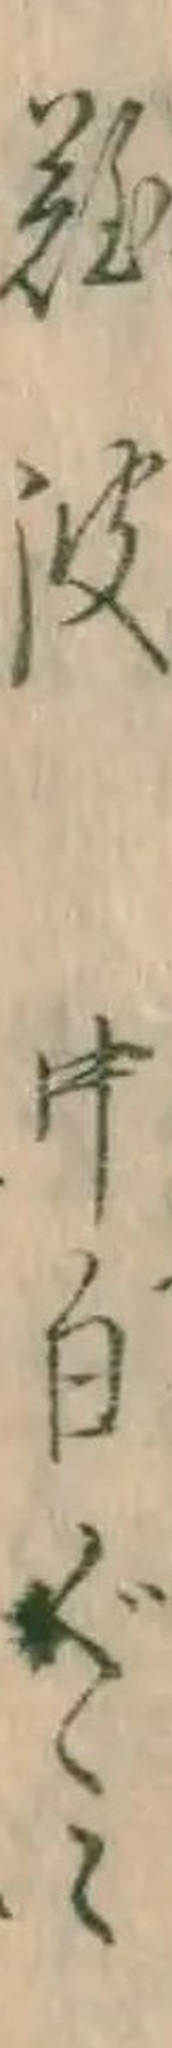難波中白ぐみ
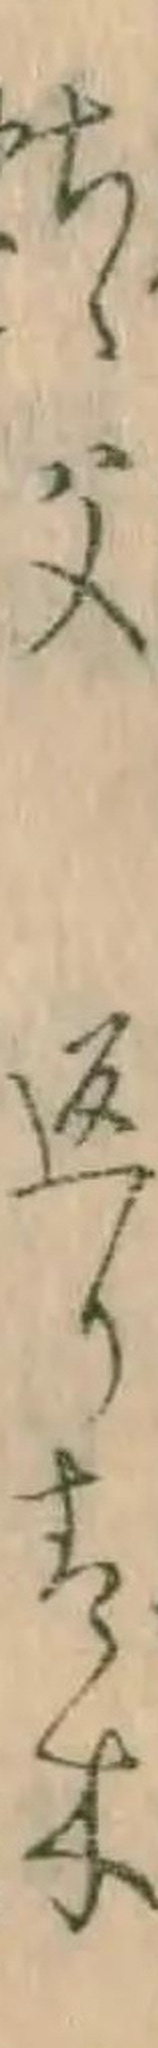ちゝ父返り青木
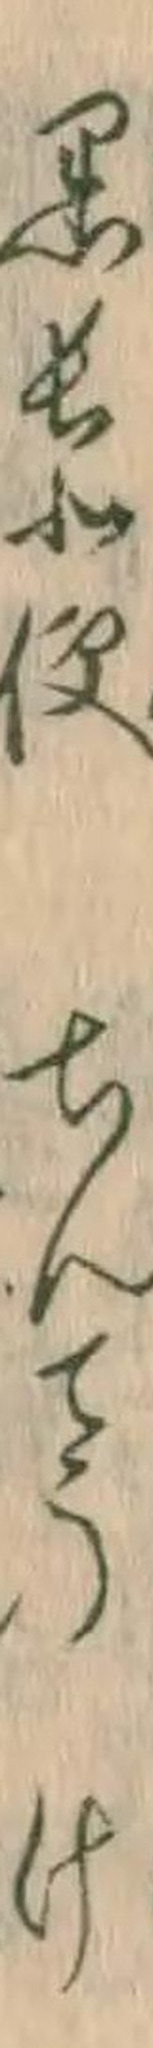黒長如便ちんてうけ
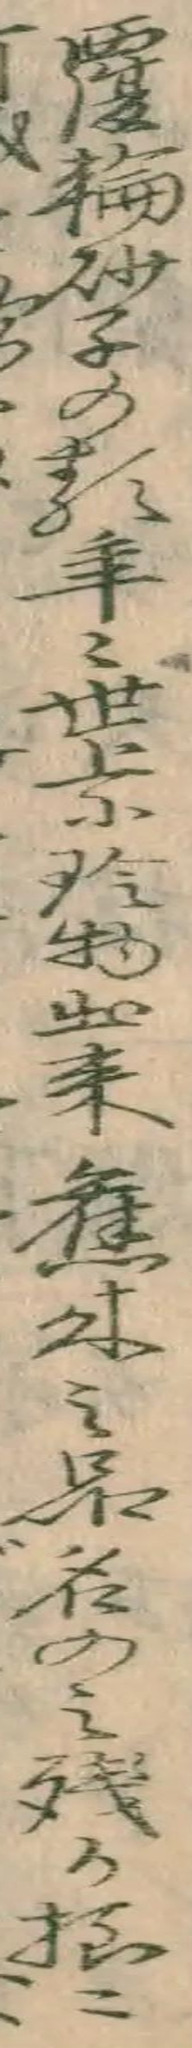覆輪砂子の類年々世上に珍物出来応旧来之品名のみ残る様に
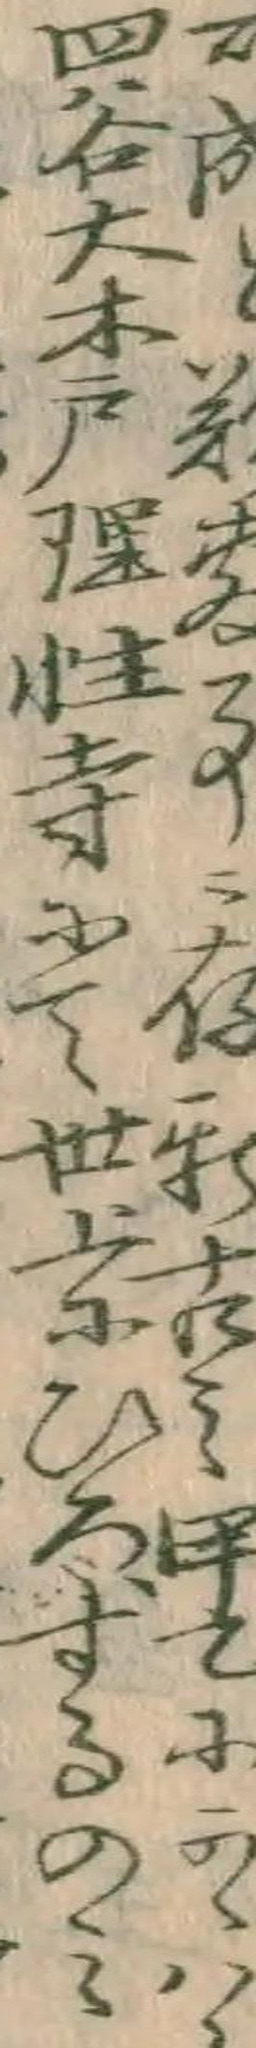四谷大木戸理性寺にて世上にひろするのみ
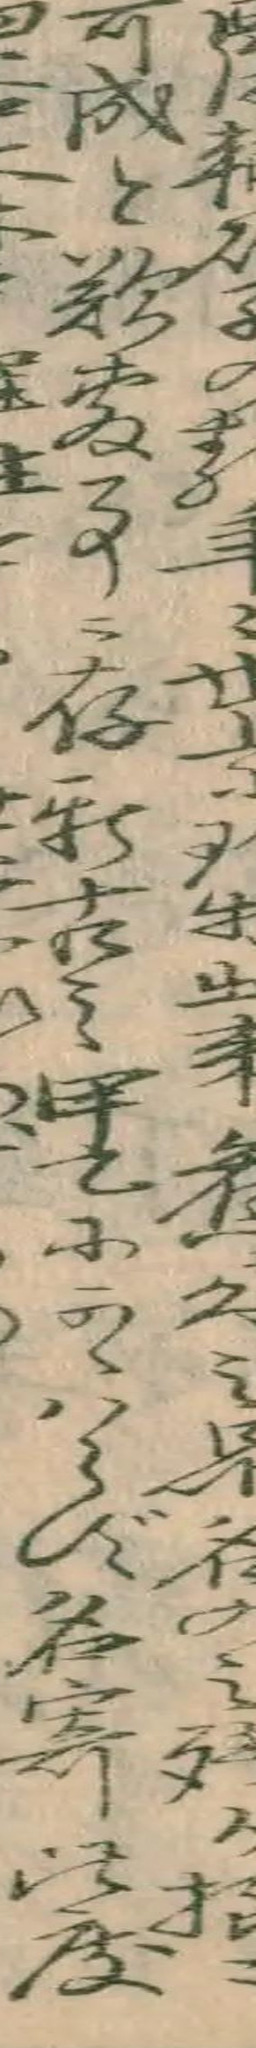可成と歎敷事に存新古之甲乙にかゝはらず名寄此度
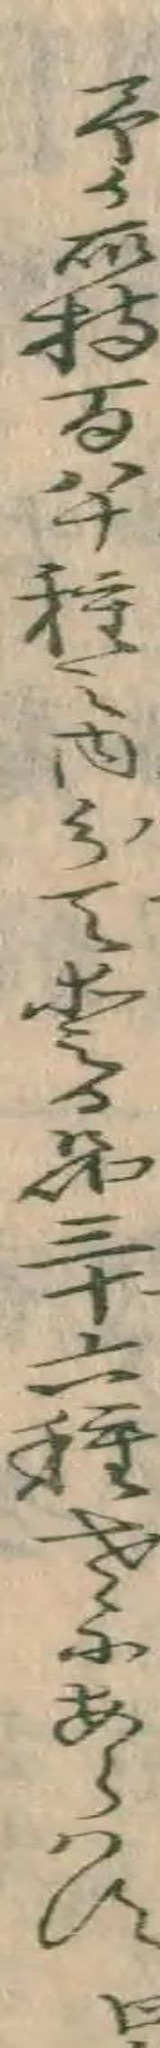予か所持百八十種之内分て愛る品三十六種世にあらはす四谷水の
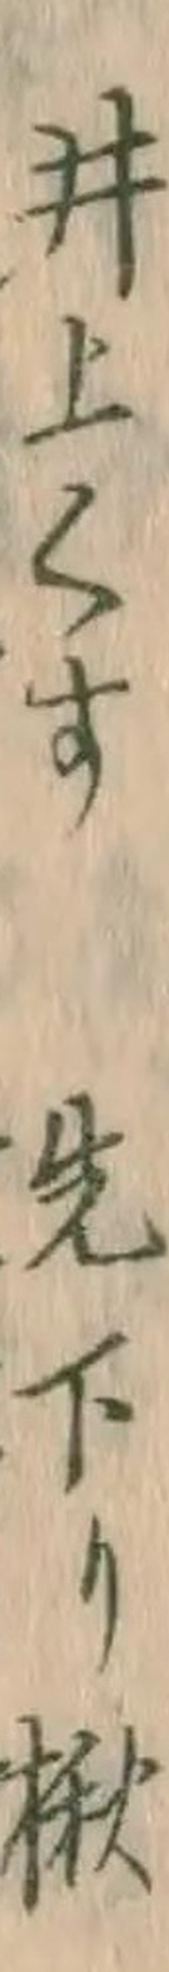井上くす先下り楸
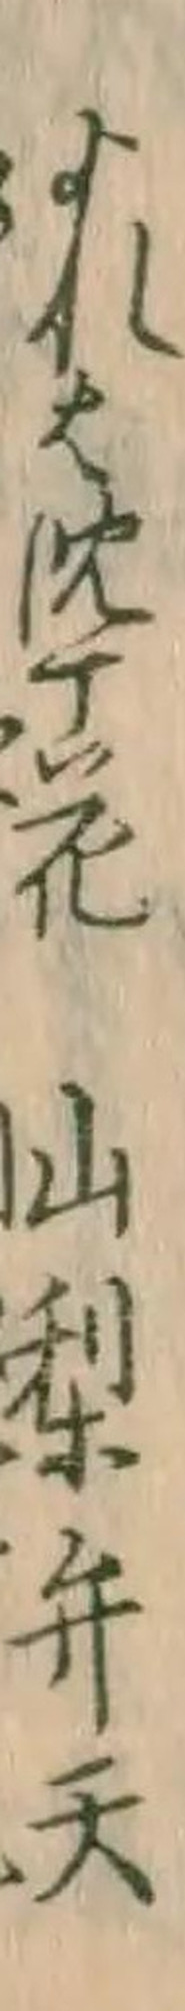よれは沈丁花山梨弁天
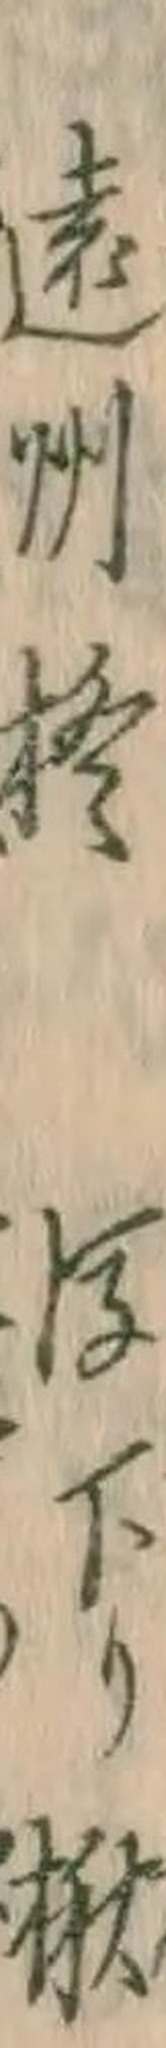遠州柊後下り楸
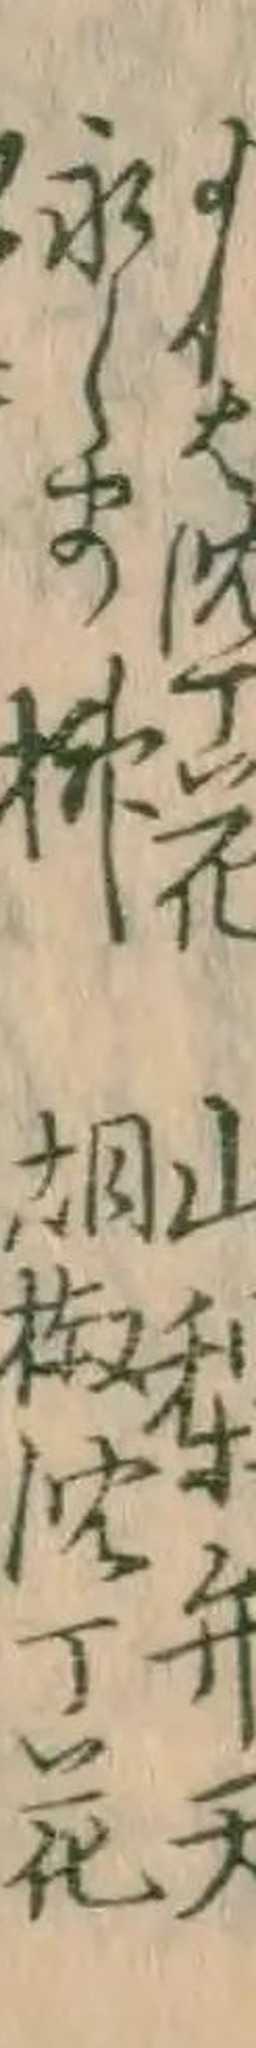永しま榊胡椒沈丁花
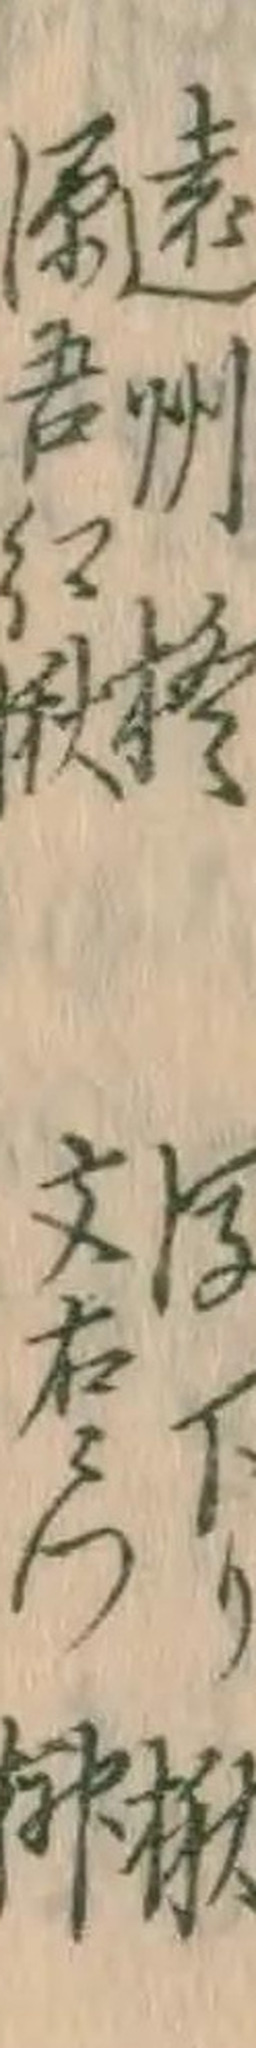源吾紅楸文右衛門榊
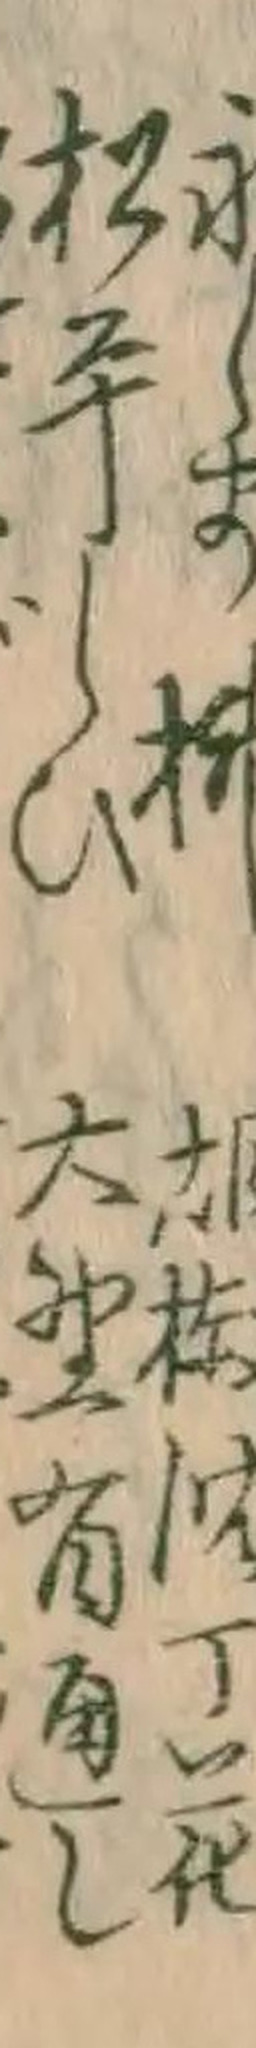松平しひ大野有通し
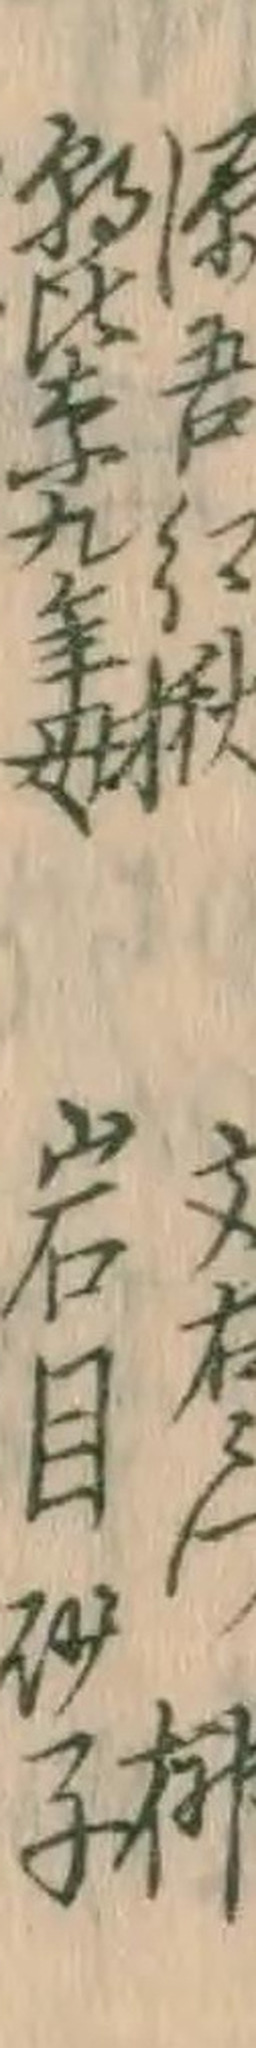朝比奈九年母岩目砂子
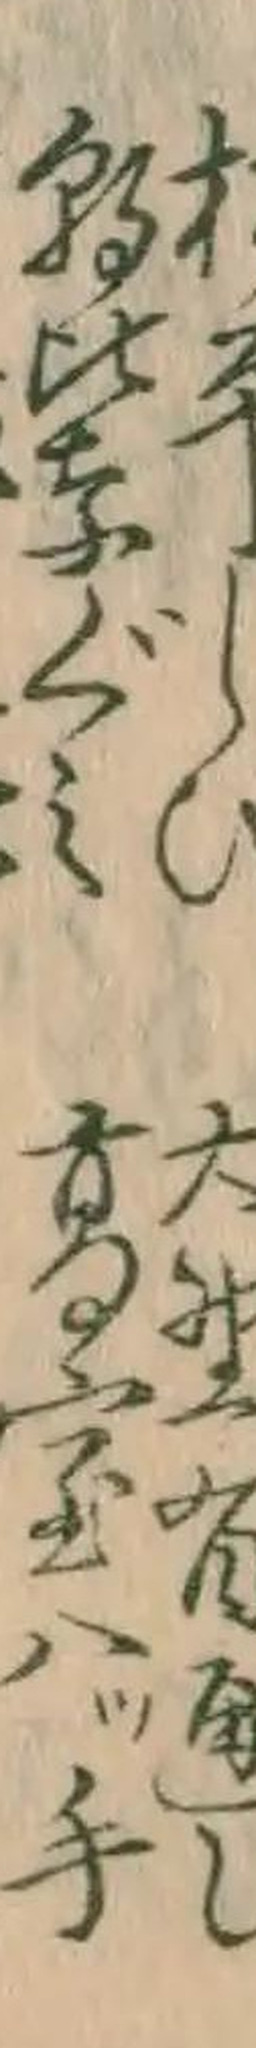朝比奈ぐみ葛室八つ手
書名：草木奇品家雅見 3巻. [3]
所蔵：国立国会図書館 National Diet Library, JAPAN
